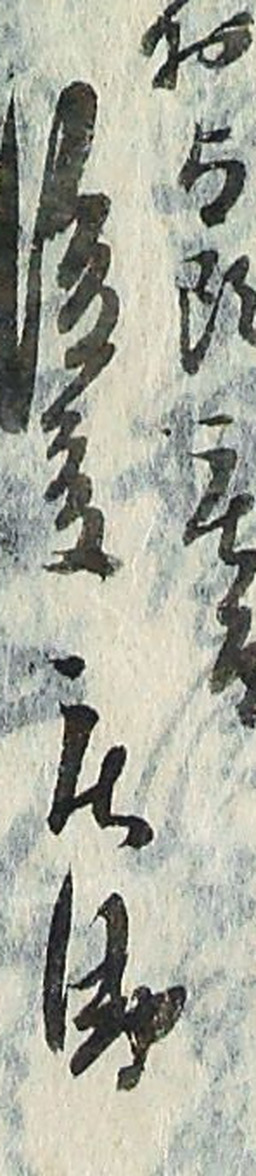後藤庄助
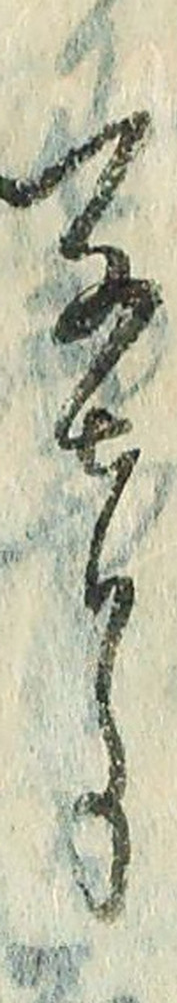子七月
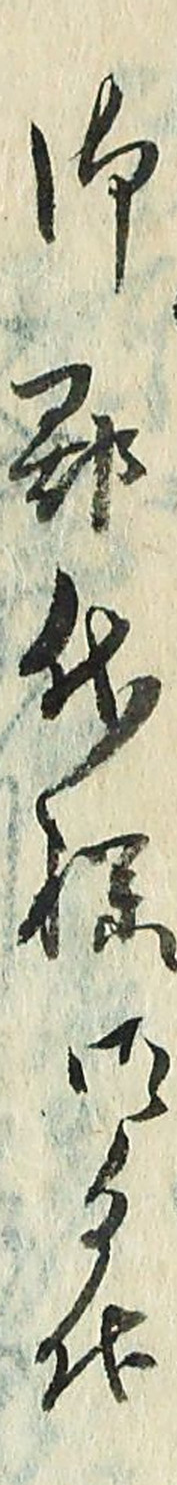御郡代様御手代
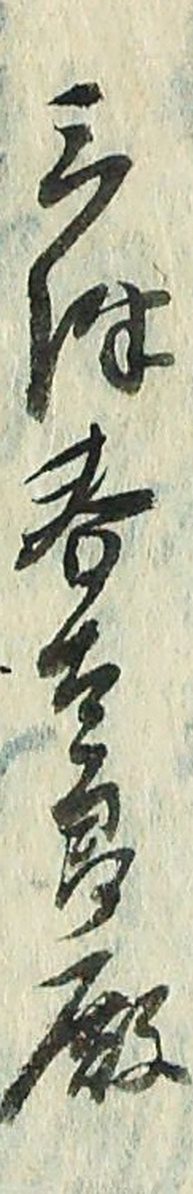三沢春太郎殿
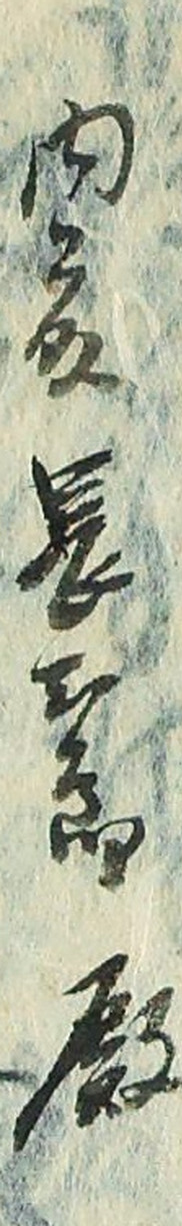内藤長三郎殿
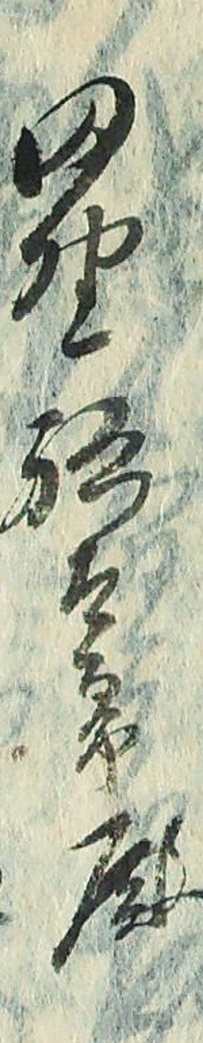田野祐太郎殿
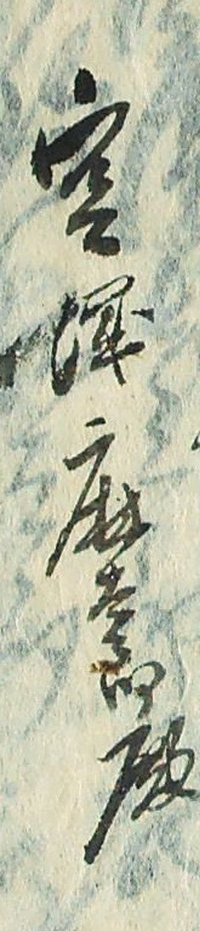宮城麻太郎殿

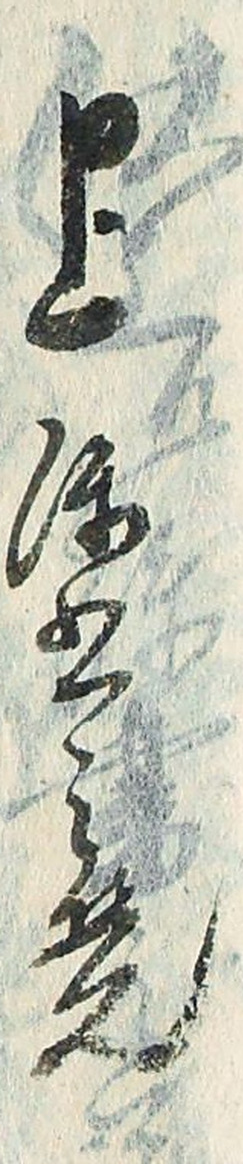申上添書之覚
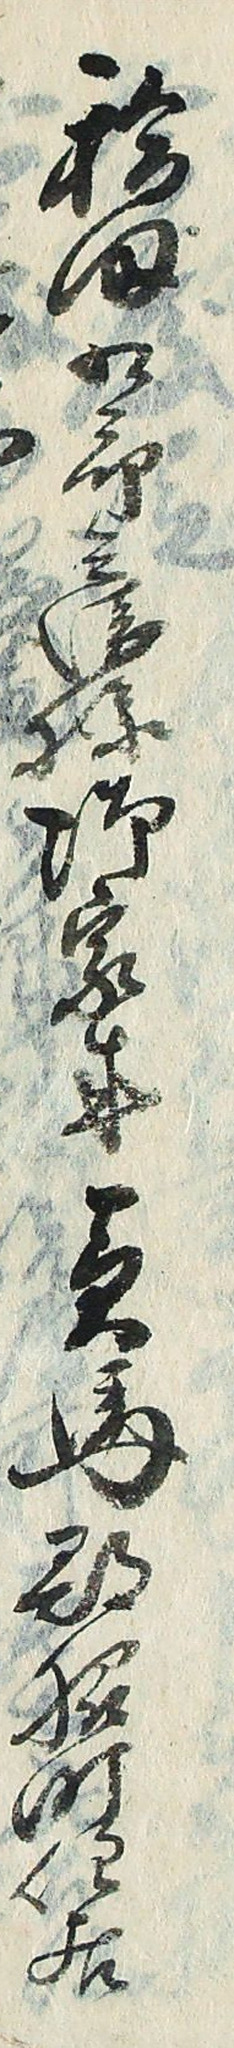稲田九郎兵衛様御家来美馬郡脇町住居
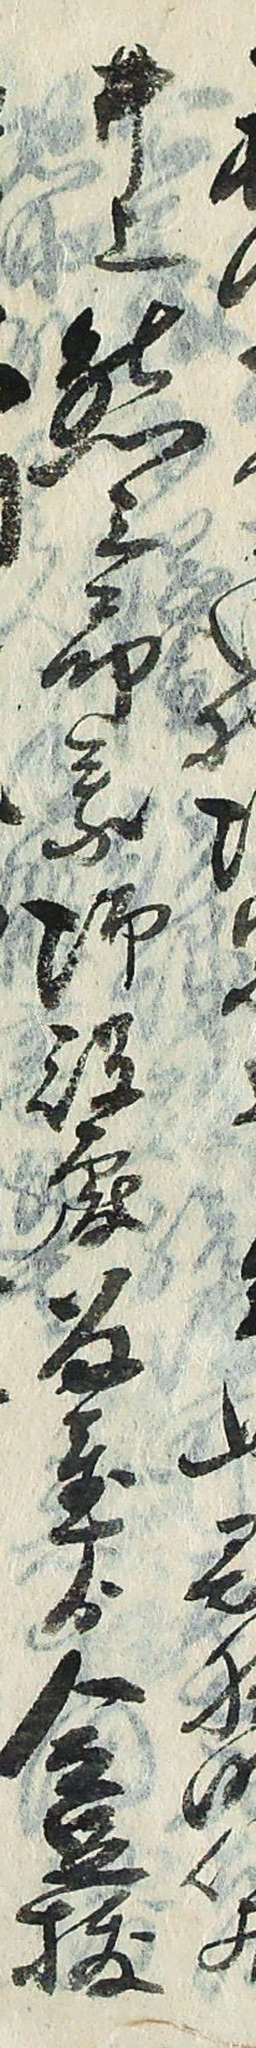井上熊三郎義御役所留置ゟ令足抜
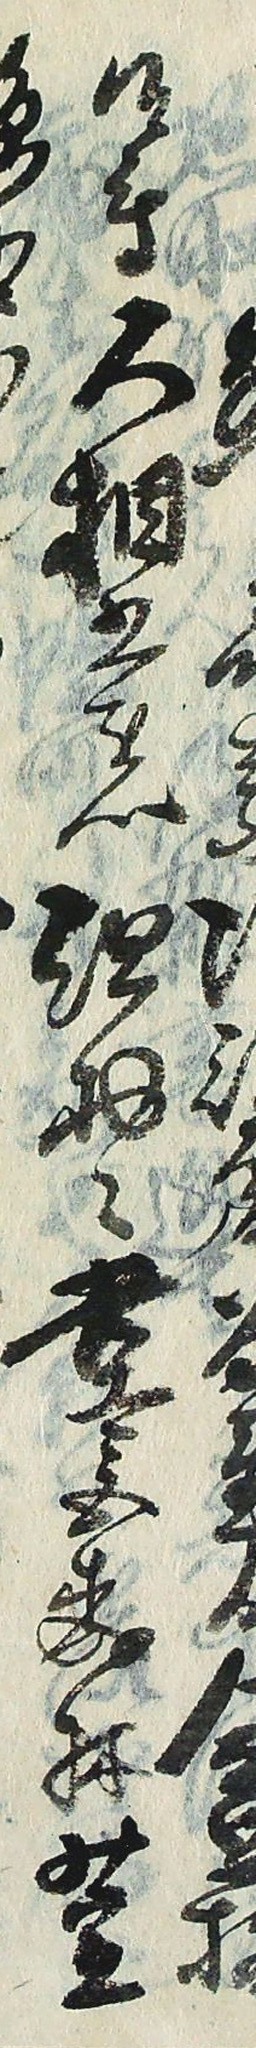候に付人相書を以組村々堂宮森林萱
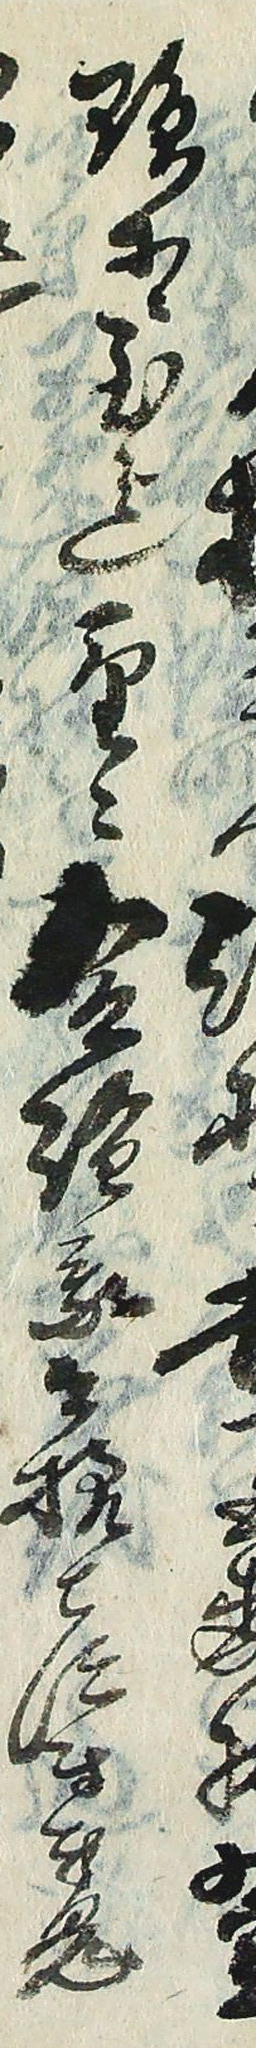野等に至迄重々人令詮義候様被仰付奉畏
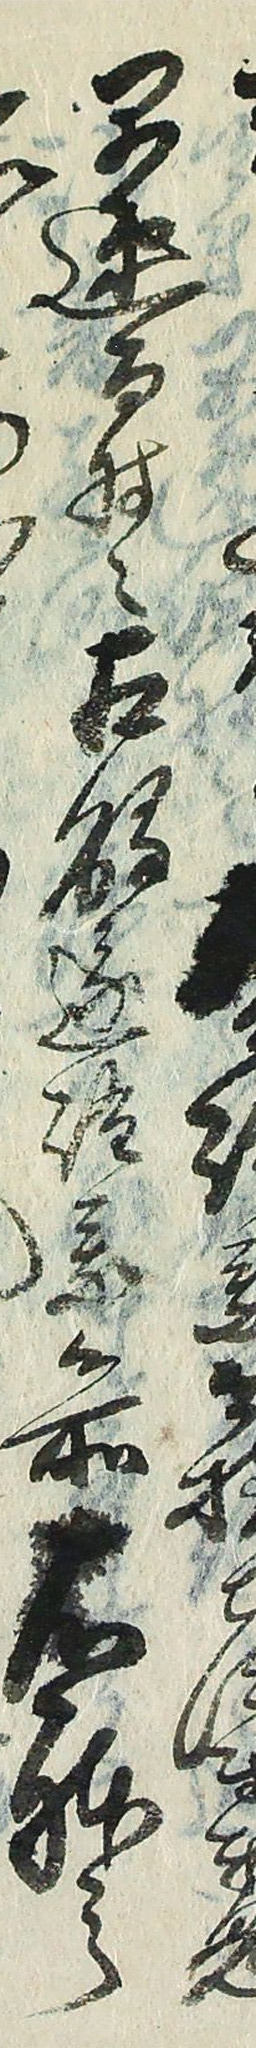早速与村々相触遂詮義候所右体之
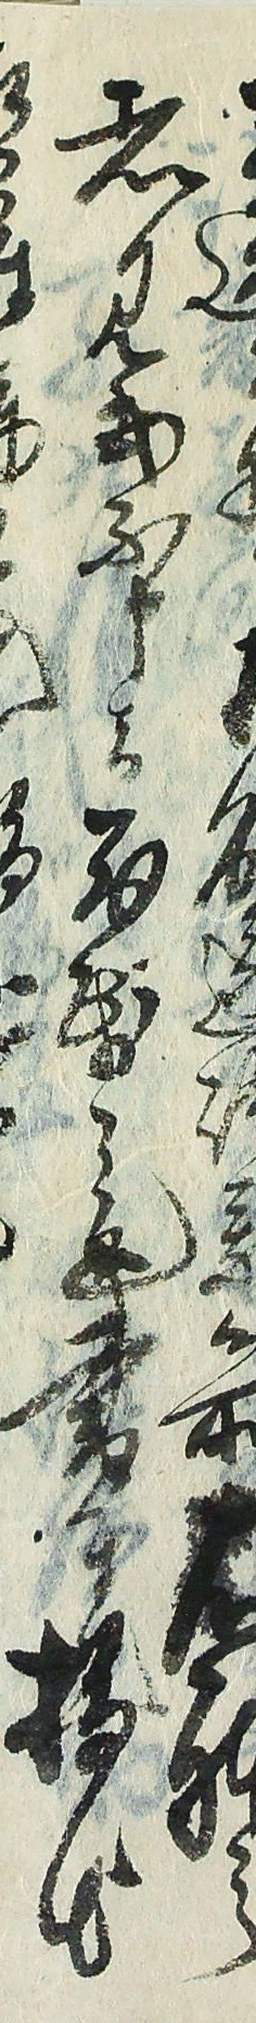者見当不申旨別帋之通書付指出
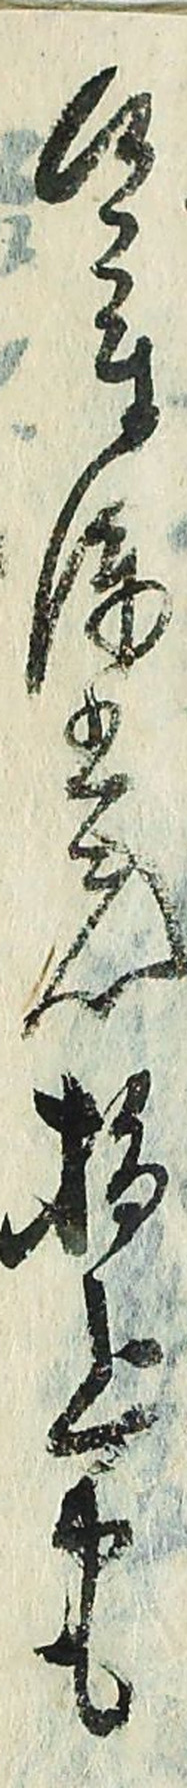候に付添書を以指上申候
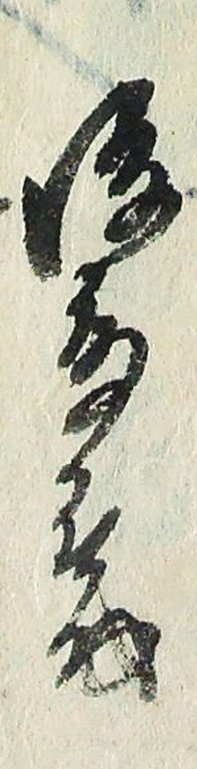後藤庄助
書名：諸御用御□受書控
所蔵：鳴門教育大学 Naruto University of Education
